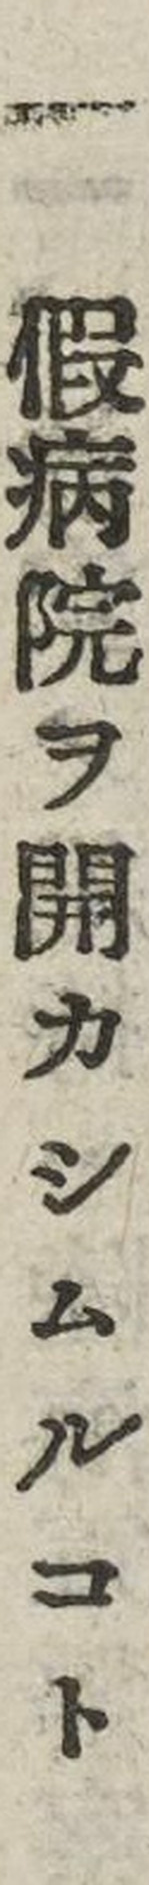仮病院ヲ開カシムルコト
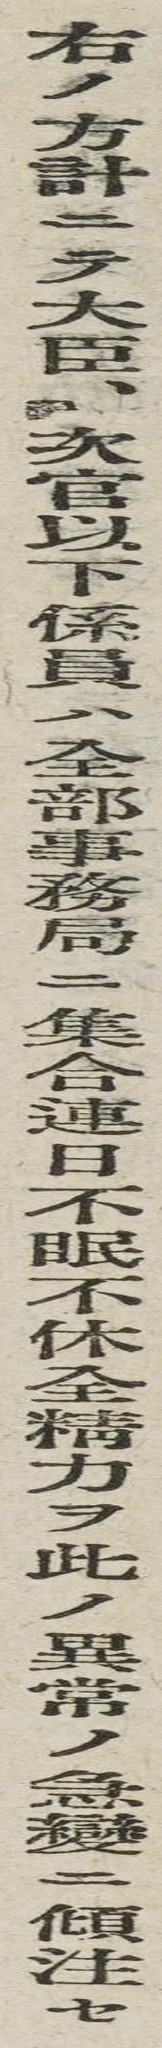右ノ方針ニテ大臣、次官以下係員ハ全部事務局ニ集合連日不眠不休全精力ヲ此ノ異常ノ急変ニ傾注セ
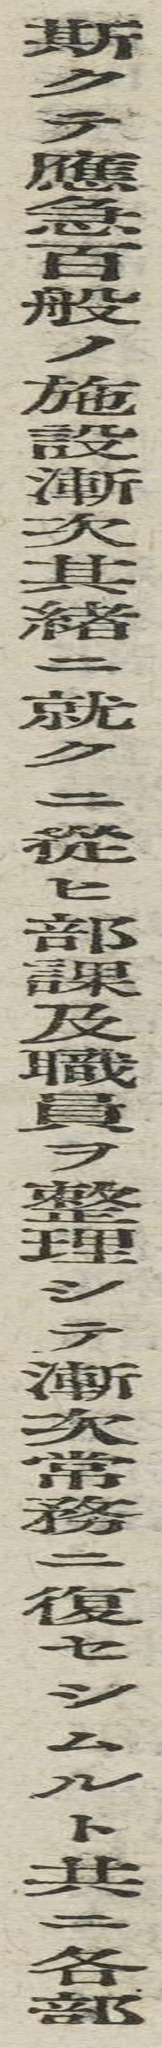斯クテ応急百般ノ施設漸次其緒ニ就クニ従ヒ部課及職員ヲ整理シテ漸次常務ニ複セシムルト共ニ各部
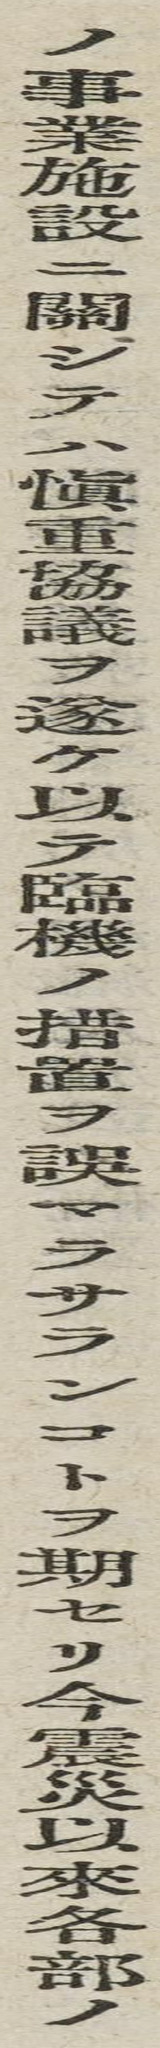ノ事業施設ニ関シテハ慎重協議ヲ遂ケ以テ臨機ノ措置ヲ誤マラサランコトヲ期セリ今震災以来各部ノ
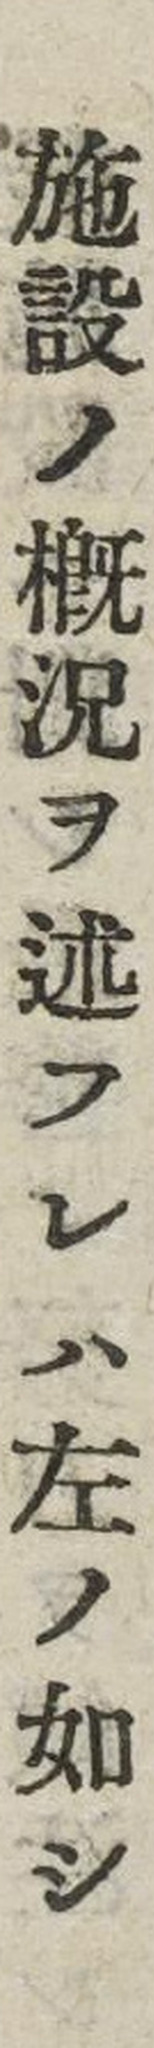施設ノ概要ヲ述フレハ左ノ如シ
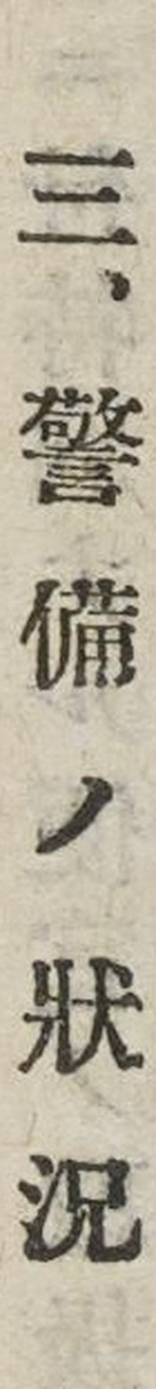三、警備ノ状況
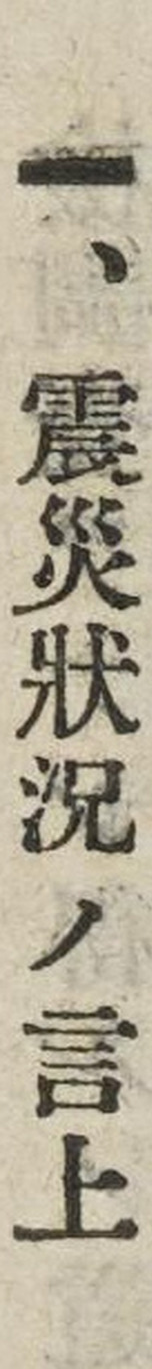一、震災状況ノ言上
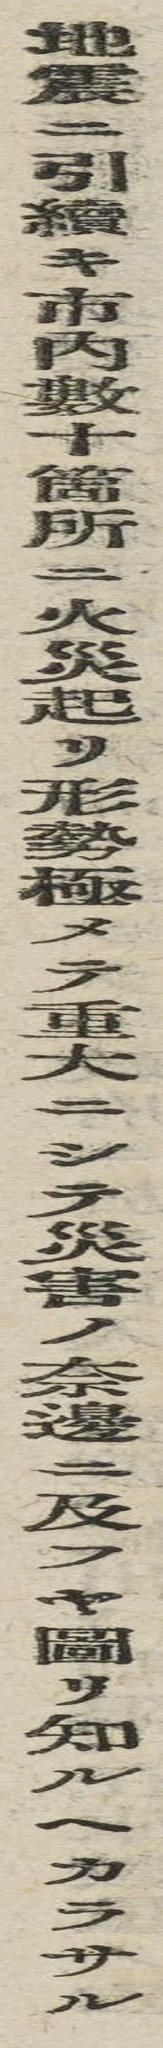地震ニ引続キ市内数十箇所ニ火災起リ形勢極メテ重大ニシテ災害ノ奈辺ニ及フヤ図リ知ルヘカラサル
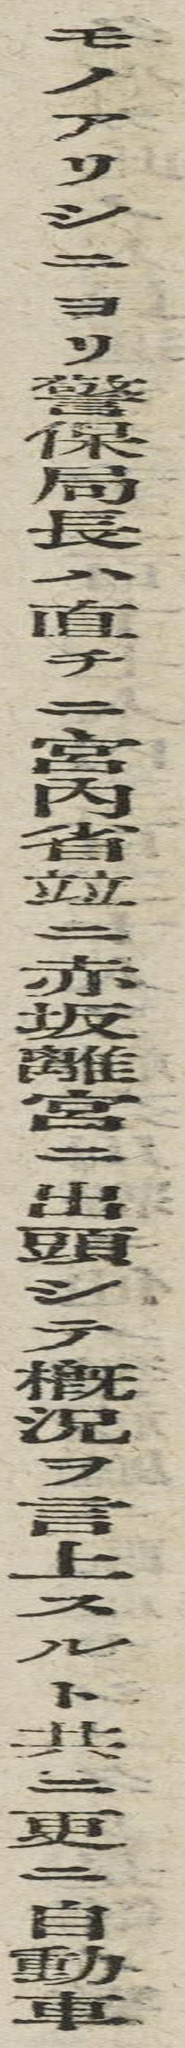モノアリシニヨリ警保局長ハ直チニ宮内省並ニ赤坂離宮ニ出頭シテ概況ヲ言上スルト共ニ更ニ自動車
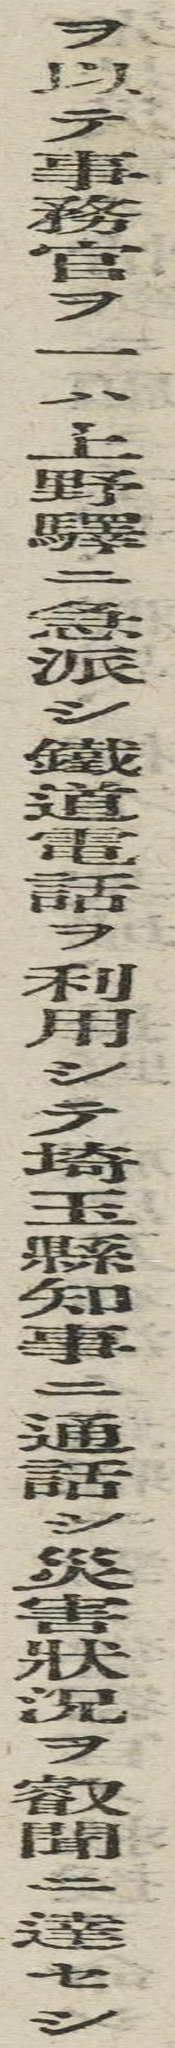ヲ以テ事務官ヲ一ハ上野駅ニ急派シ鉄道電話ヲ利用シテ埼玉県知事ニ通話シ災害状況ヲ叡聞ニ達セシ
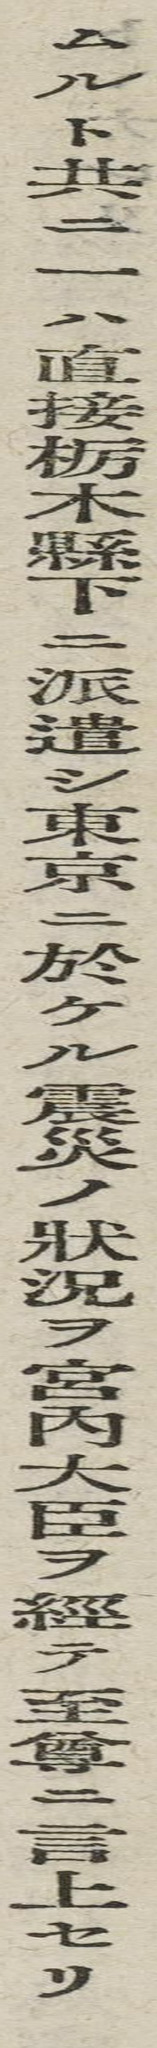ムルト共ニ一ハ直接栃木県下ニ派遣シ東京ニ於ケル震災ノ状況ヲ宮内大臣ヲ経テ至尊ニ言上セリ
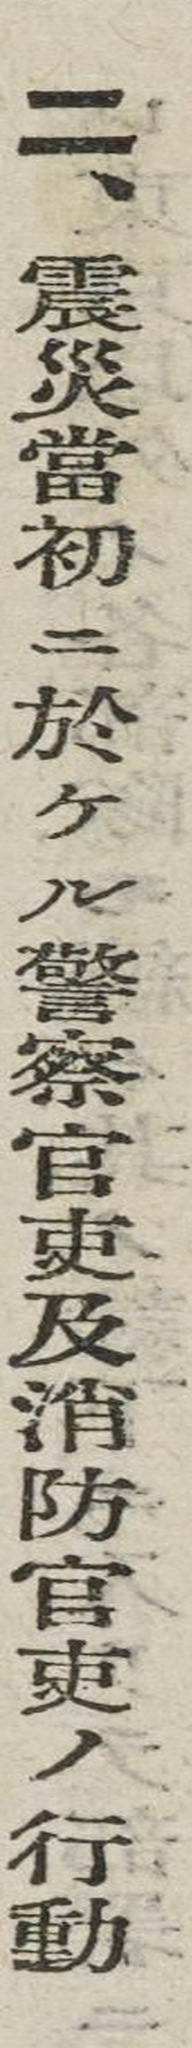ニ、震災当初ニ於ケル警察官吏及消防官吏ノ行動
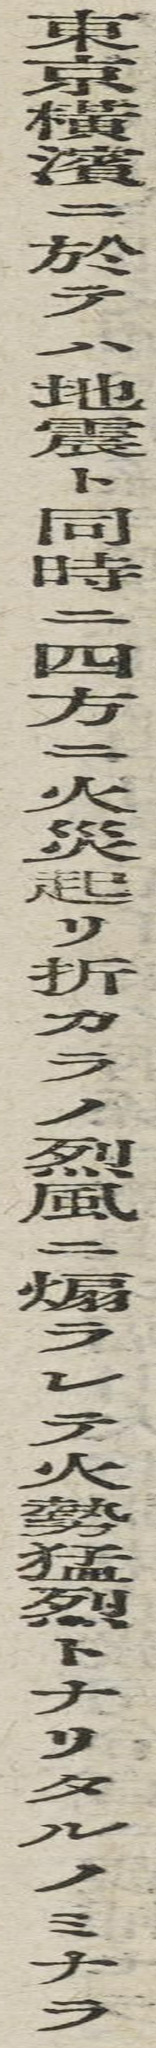東京横浜ニ於テハ地震ト同時ニ四方ニ火災起リ折カラノ烈風ニ煽ラレテ火勢猛烈トナリタルノミナラ
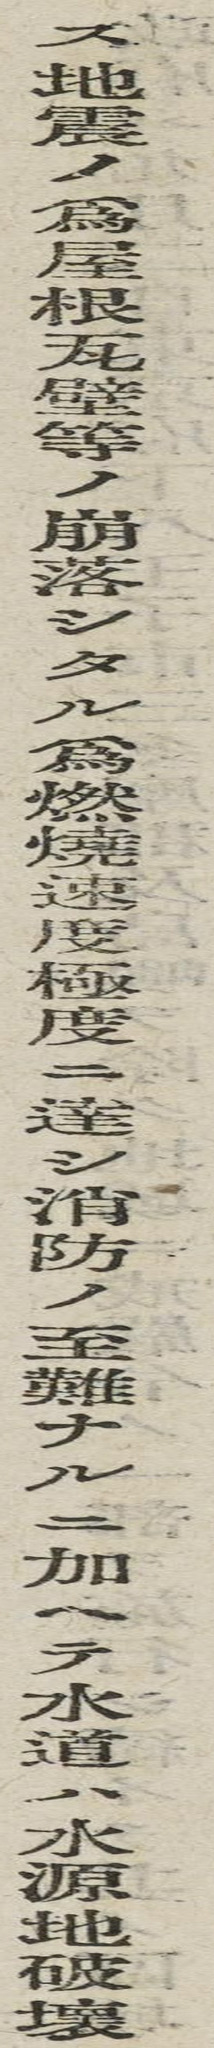ス地震ノ為屋根瓦壁等ノ崩落シタル為燃焼速度極度ニ達シ消防ノ至難ナルニ加ヘテ水道ハ水源地破壊
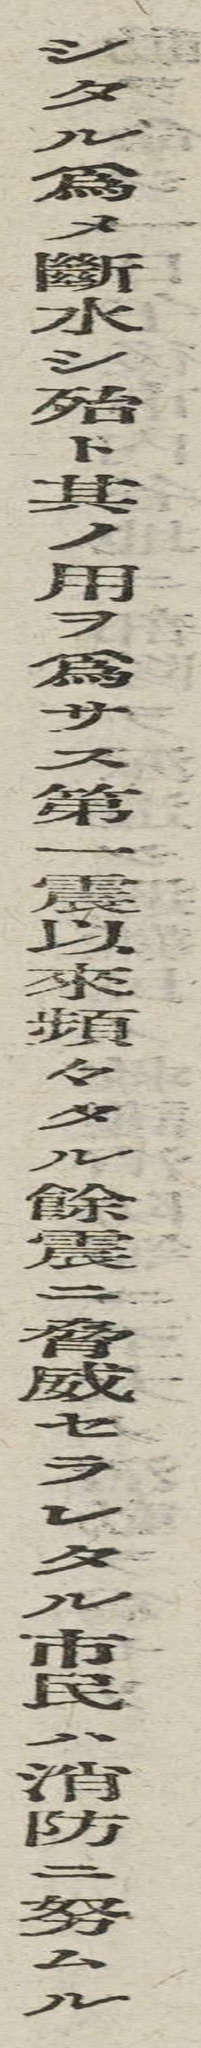シタル為メ断水シ殆ト其ノ用ヲ為サス第一震以来頻々タル余震ニ脅威セラレタル市民ハ消防ニ務ムル
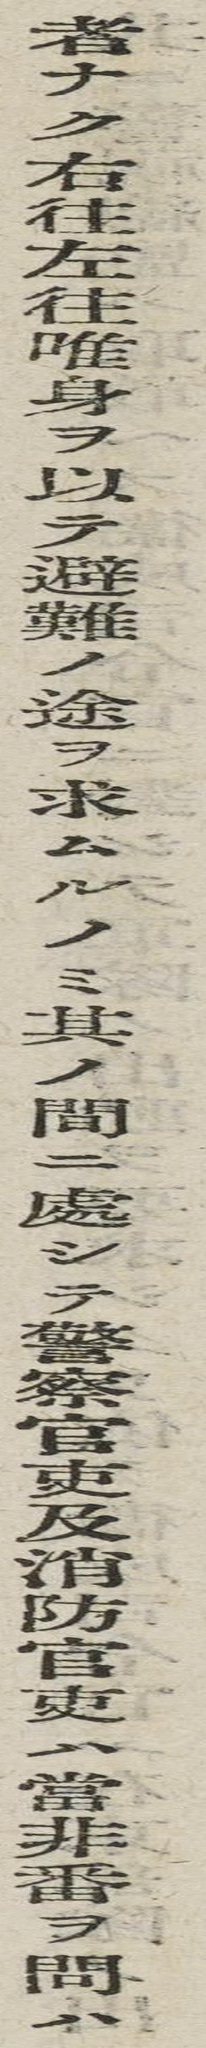者ナク右往左往唯身ヲ以テ避難ノ途ヲ求ムルノミ其ノ間ニ処シテ警察官吏及消防官吏ハ当非番ヲ問ハ
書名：震災被害状況並救護施設概要
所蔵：東京大学地震研究所図書室 Earthquake Research Institute Library, The University of Tokyo, JAPAN
